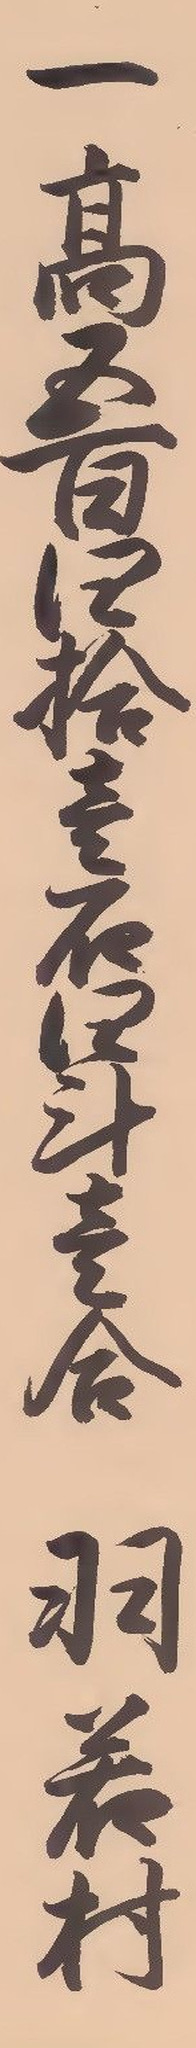一高五百四拾壱石四斗壱合羽若村
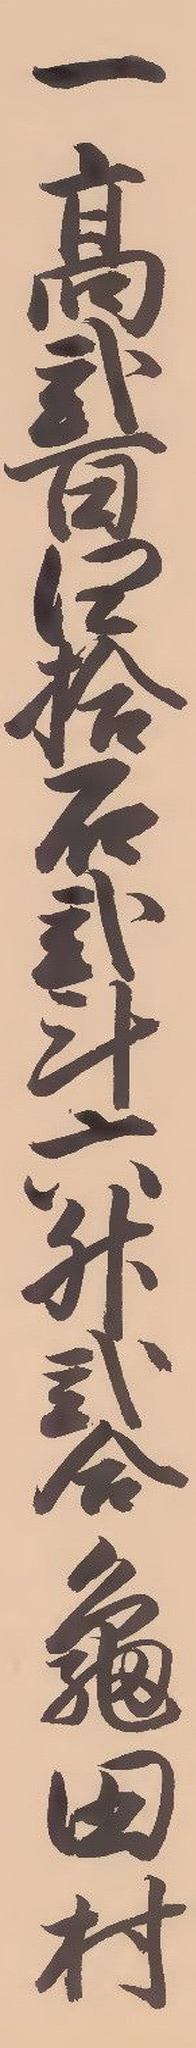一高弐百四拾石弐斗六升弐合亀田村
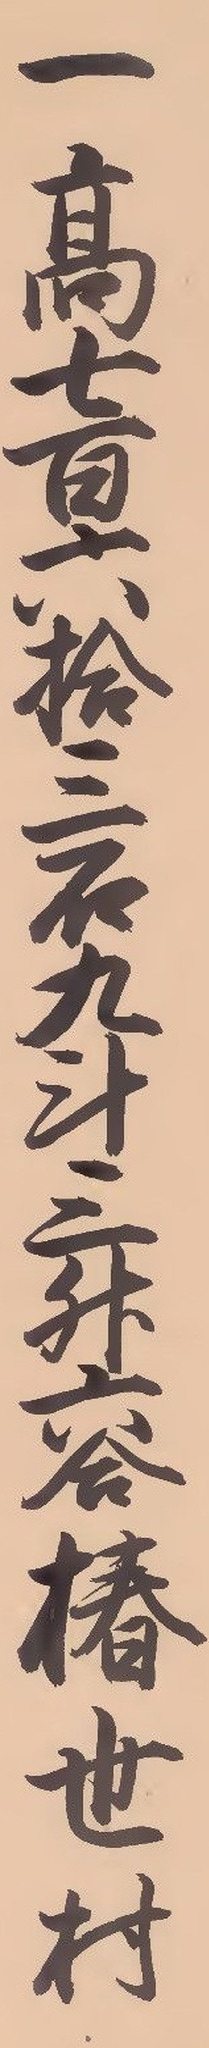一高七百六拾三石九斗三升六合椿世村
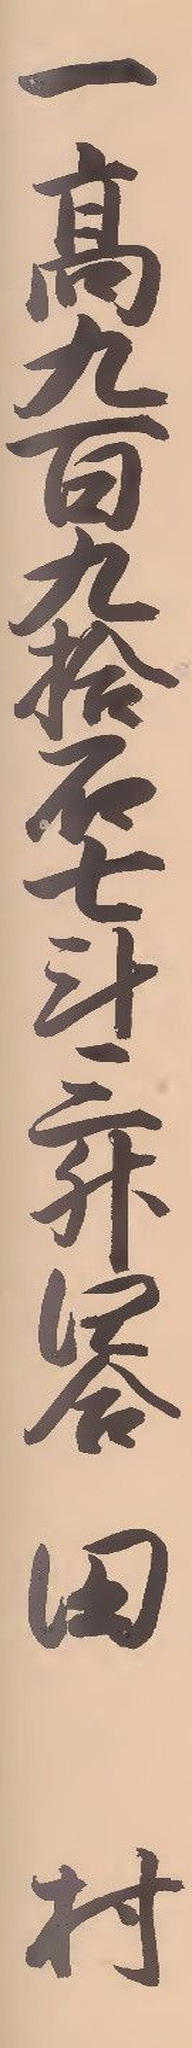一高九百九拾石七斗三升四合田村
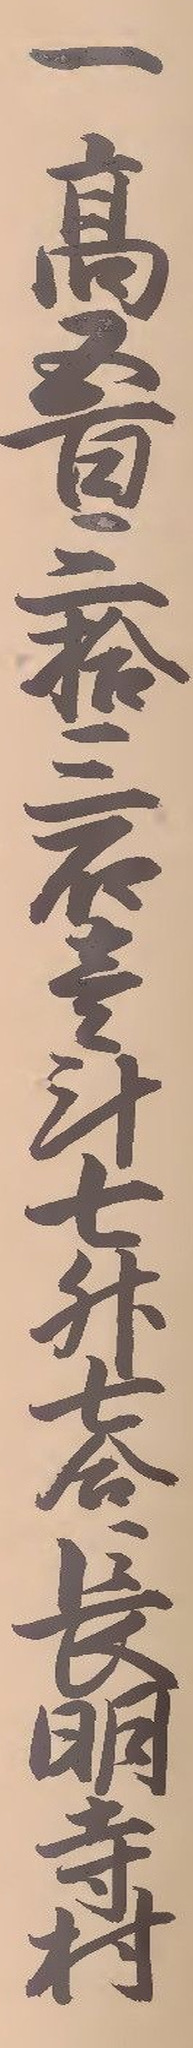一高五百三拾三石壱斗七升七合長明寺村
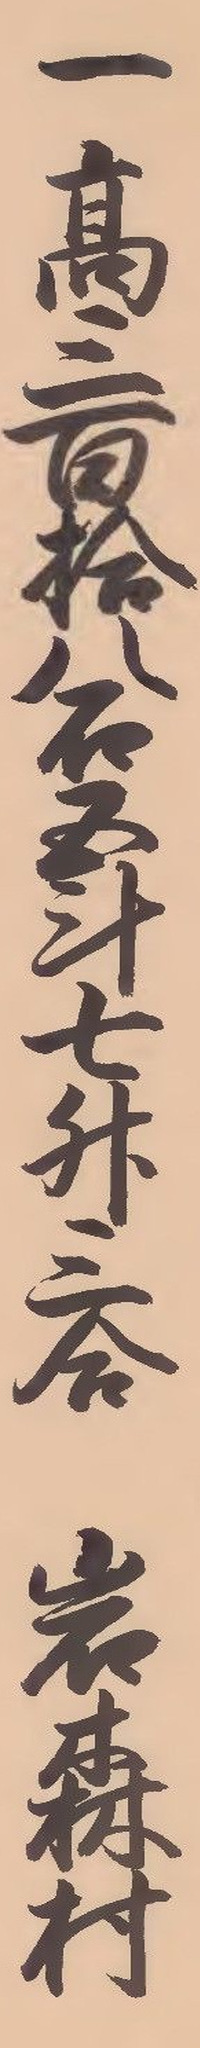一高三百拾八石五斗七升三合岩森村
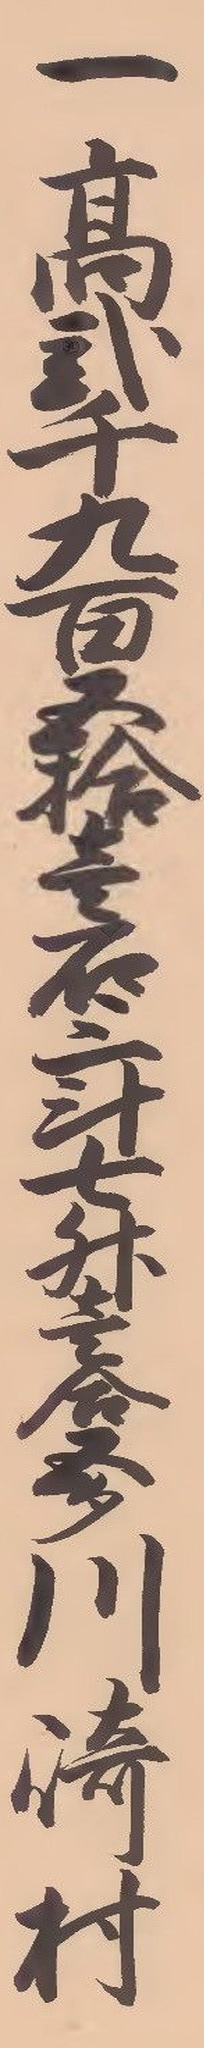一高弐千九百五拾壱石三斗七升壱合五勺川崎村

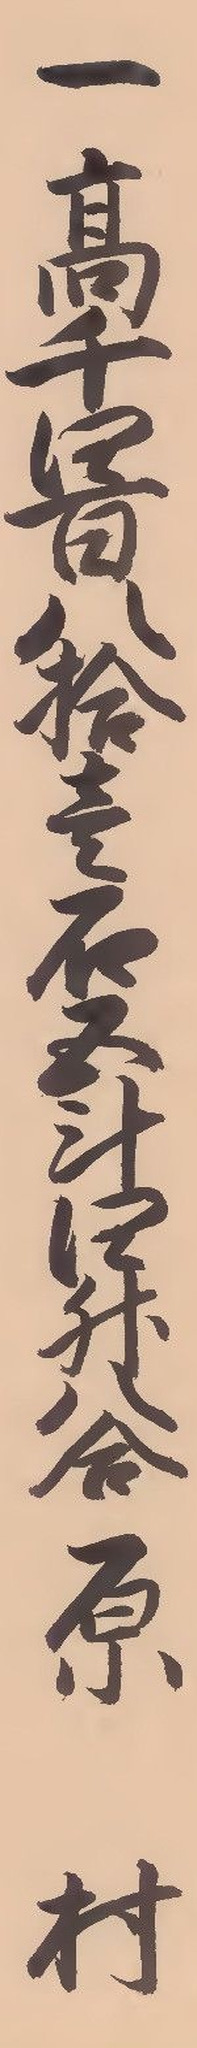一高千四百八拾壱石五斗四升八合原村
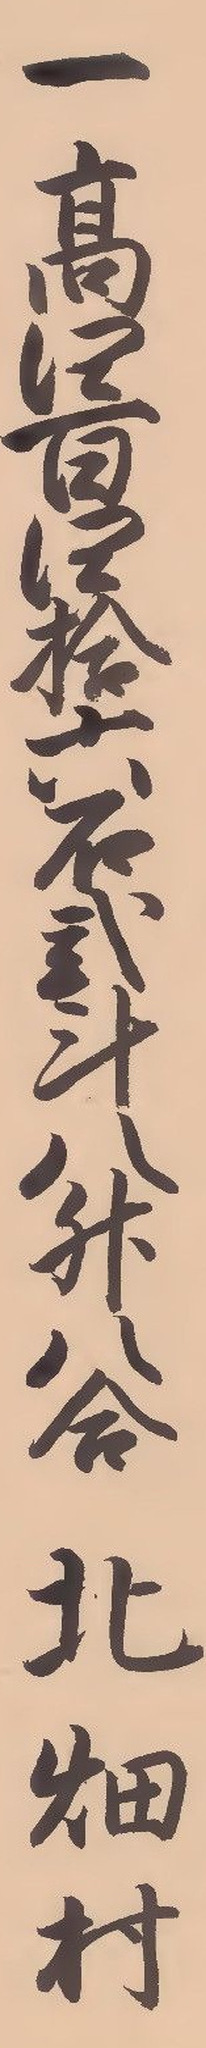一高四百四拾六石弐斗八升八合北畑村
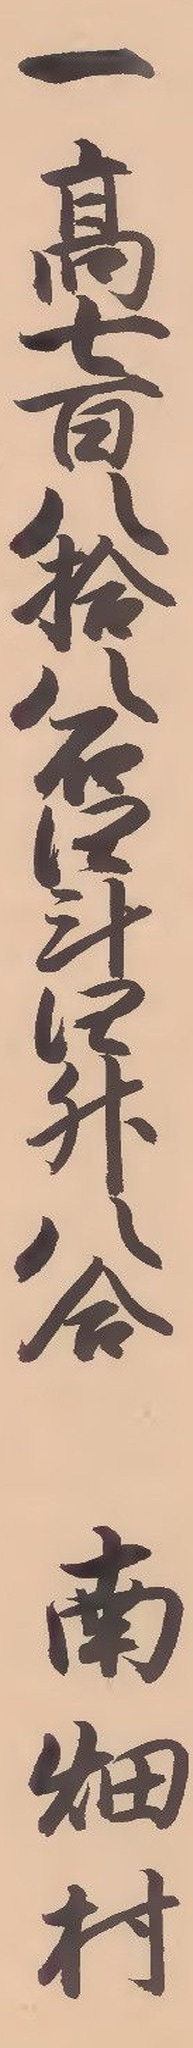一高七百八拾八石四斗四升八合南畑村
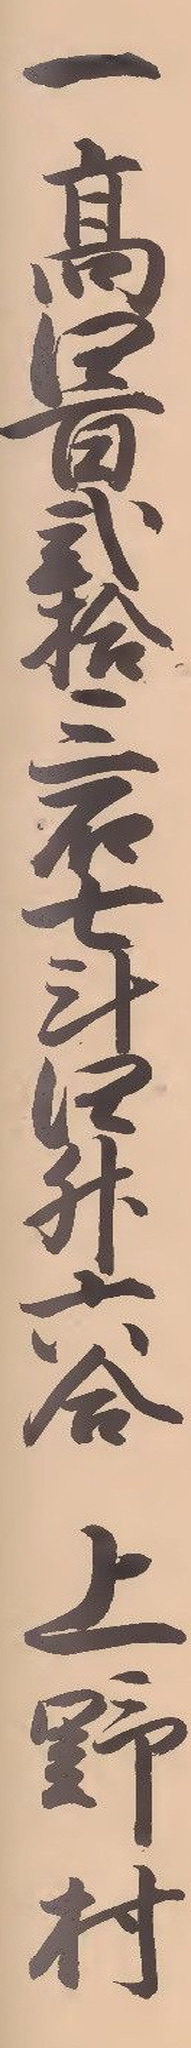一高四百弐拾三石七斗四升六合上野村
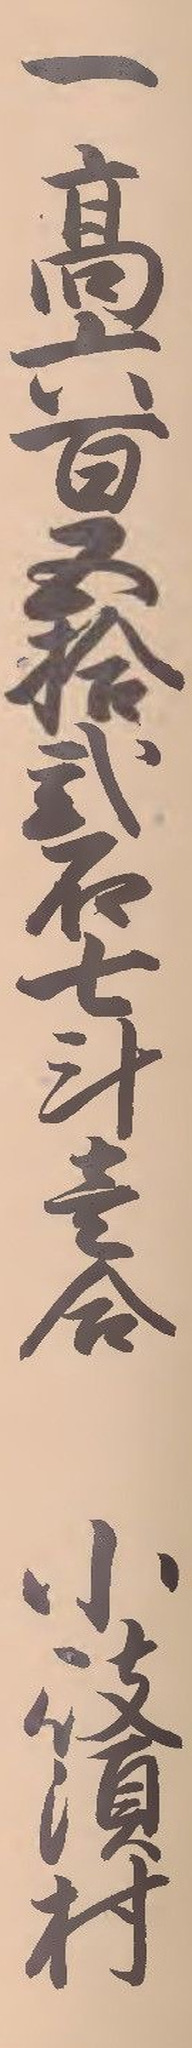一高六百五拾弐石七斗壱合小岐須村
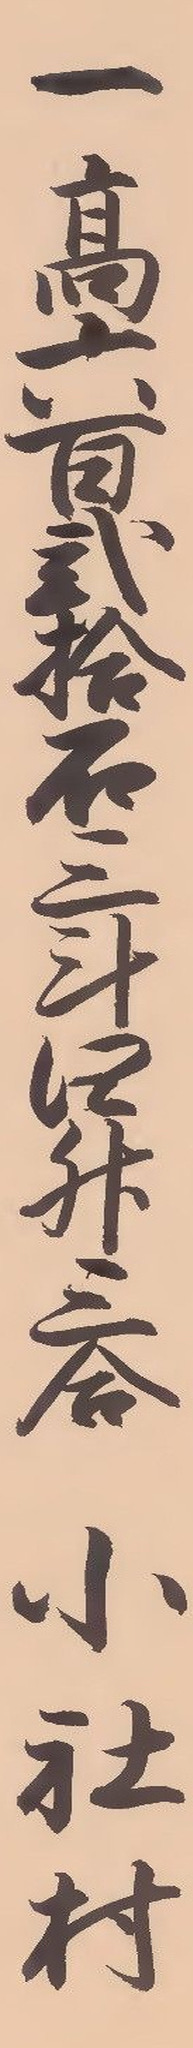一高六百弐拾石三斗四升三合小社村
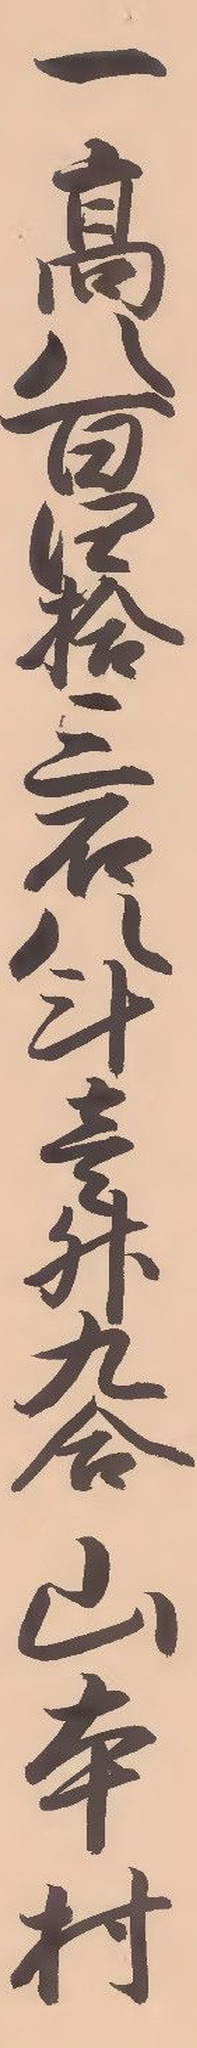一高八百四拾三石八斗壱升九合山本村
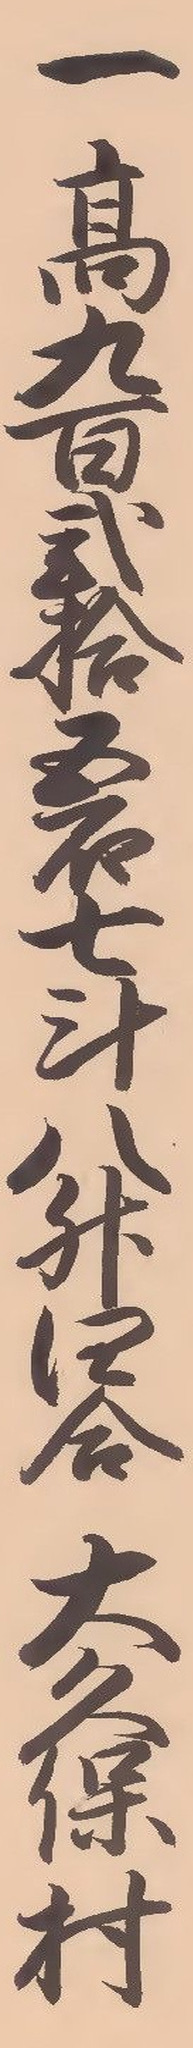一高九百弐拾五石七斗八升四合大久保村

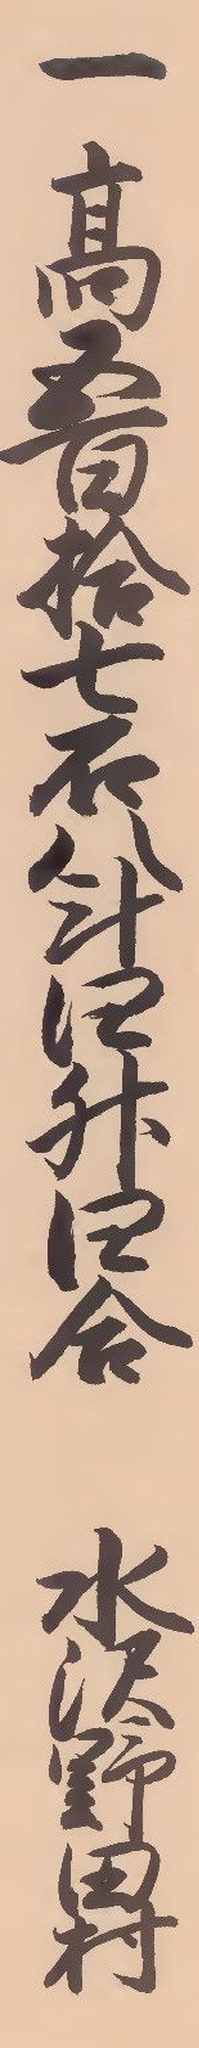一高五百拾七石八斗四升四合水沢野田村
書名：伊勢国郷帳
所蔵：国立公文書館 National Archives of Japan
